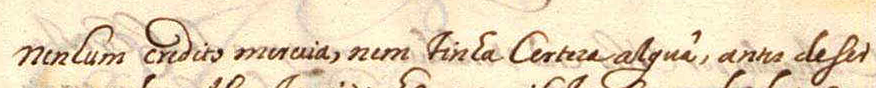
nenhum credito merecia, nem tinha Certeza alguā, antes de ser
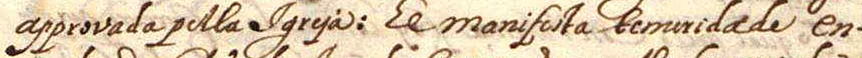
approvada pella Igreja: he manifesta temeridade en
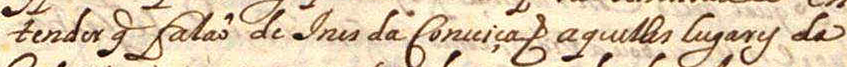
tender q̄ falaõ de Ines da Conceiçaõ aquelles lugares da
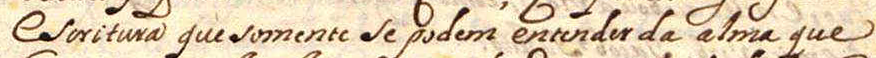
Escritura que somente se podem entender da alma que
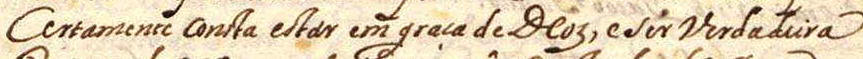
Certamente consta estar em graça de Deoz, e ser Verdadeira
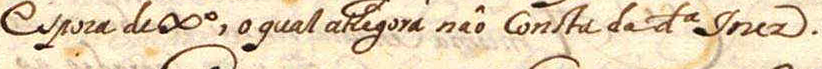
Espoza de Xo, o qual athegora naõ consta da d̄a Inez.
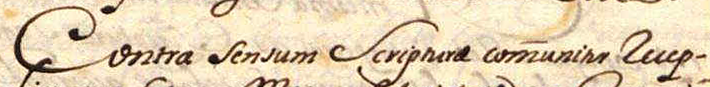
Contra sensum Scripturæ com̄unitur Recep
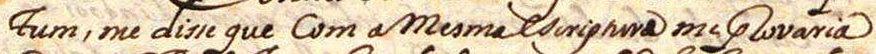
tum, me disse que com a mesma Escriptura me provaria
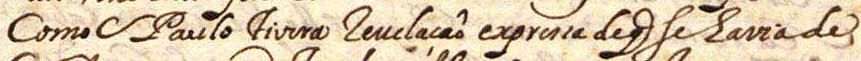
Como S Paulo tivera Reuelaçaõ expressa de q̄ se havia de
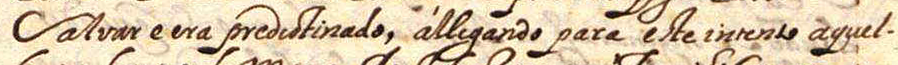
Salvar e era predestinado, allegando para este intento aquel
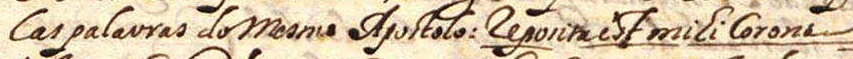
las palavras do mesmo Apostolo: Reposita est mihi Corona
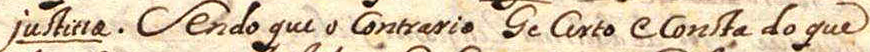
justissæ. Sendo que o Contrario he certo e consta do que
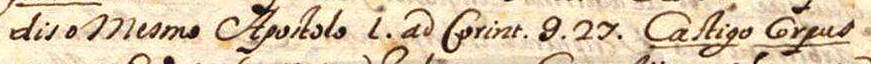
dis o mesmo Apostolo 1. ad Corint. 9. 27. Castigo Corpus
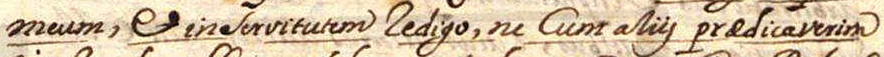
meum, & in servitutem Redigo, ne Cum aliis prædicaverim
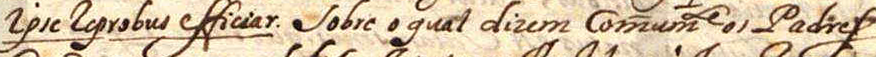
Ipse Reprobus efficiar Sobre o qual dizem com̄umte os Padres
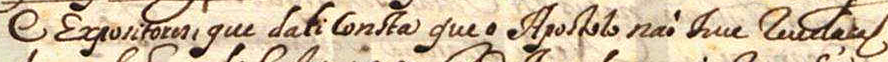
e Expositores, que dali consta que o Apostolo naõ teue Reuelaçaõ
